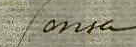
Conta
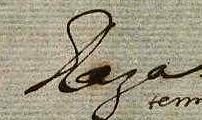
Raza
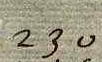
230
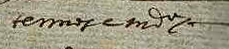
termos e mdos
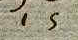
15
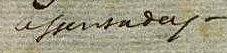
assentadas
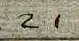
21
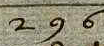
296
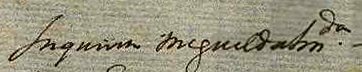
Inquirir miguel dalm.da
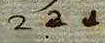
221
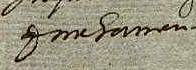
q̄m chamou
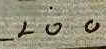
100
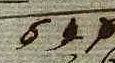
617
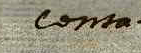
conta
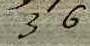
36
